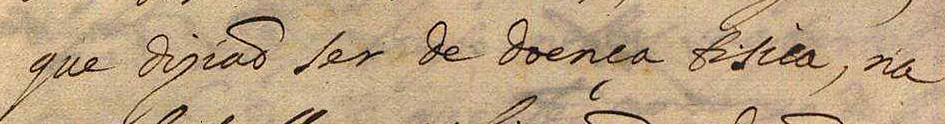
que dizião ser de doença tisica, na
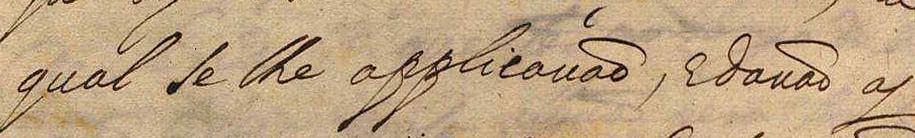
qual se lhe applicauão, E dauão as
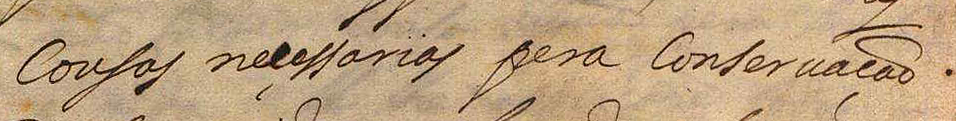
Cousas neçessarias pera conseruação
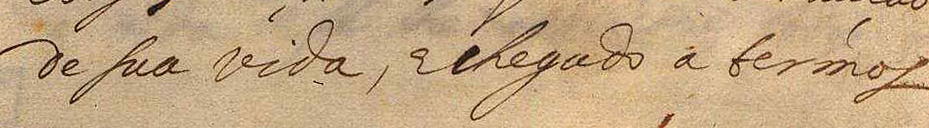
de sua vida, E chegado a termos
